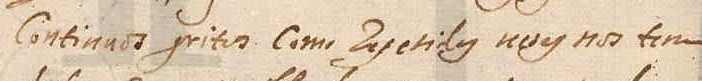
Continuos gritos como Repetidas ueses nos tem
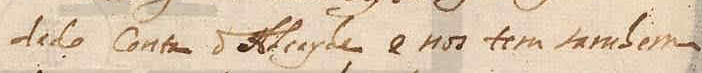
dado conta o Alcayde, e nos tem tambem
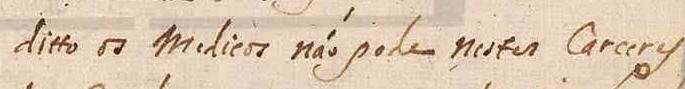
ditto os Medicos naõ pode nestes Carceres
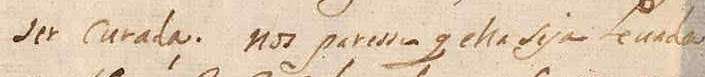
ser curada; nos paresse q̄ ella seja leuada
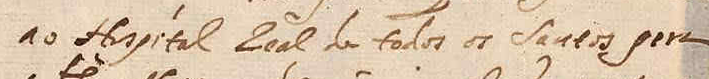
ao Hospital Real de todos os Santos pera
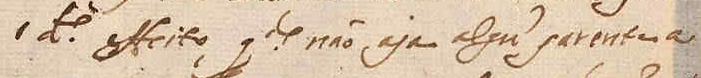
o d̄.o effeito, q.do naõ aja algū parente a
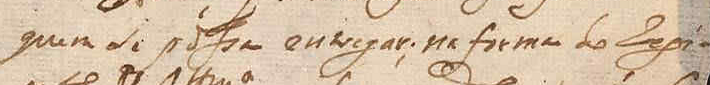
quem se possa entregar, na forma do Regi
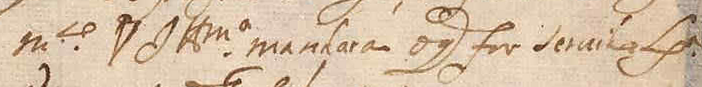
m.to V Illm.a mandara o q̄ for seruido Lx.a
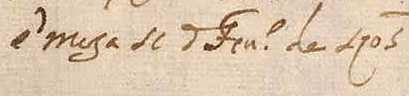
ē meza 11 d Feu.ro de 1705
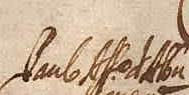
Paulo Aff.o de Albu
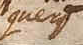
querq̄
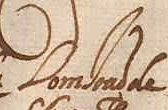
Dom Ioaõ de
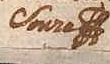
Souza
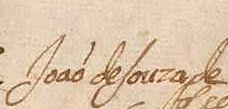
Joaõ de Souza de
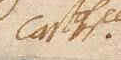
Casto br.co
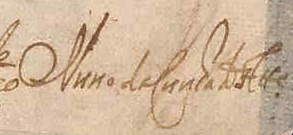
Nuno da Cunha d̄ Atte
